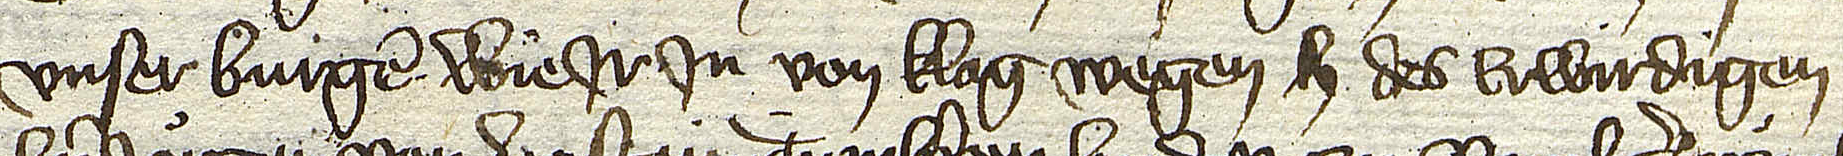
vnſer burge* wie Ir In von klag wegen h des Erwirdigen
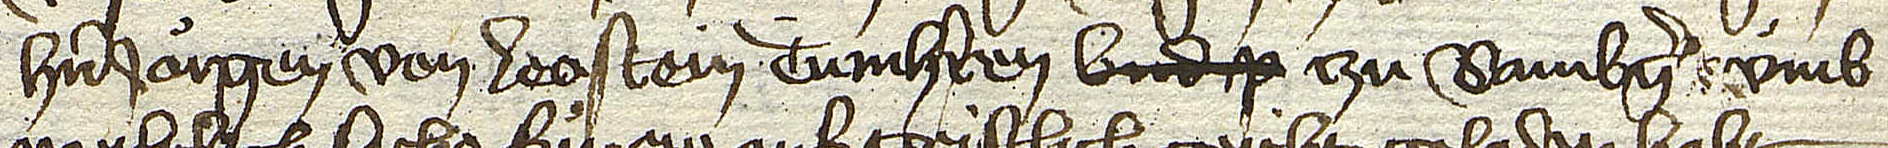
h*n Iörgen von Leoſtein Tumh*ren vnd p cʒu Bamb*g v̈mb
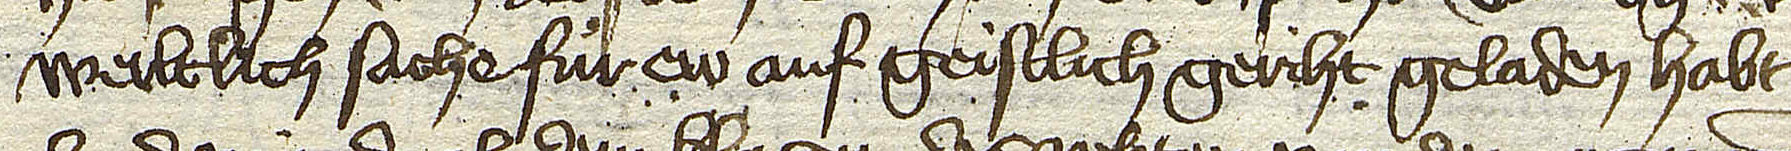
werltich ſache für ew auf geiſtlich geriht geladen habt
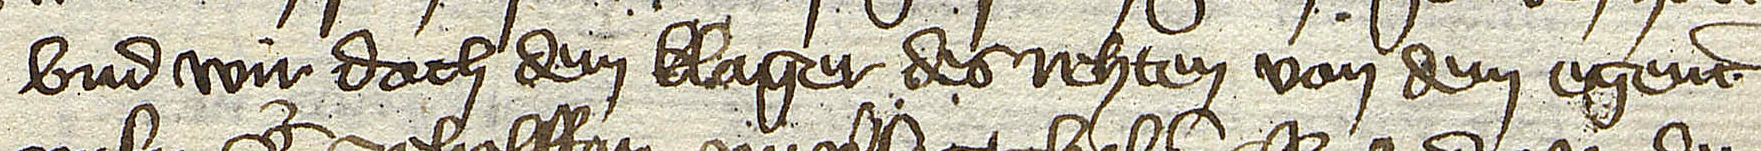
vnd wir doch dem klager des rehten von dem egent*
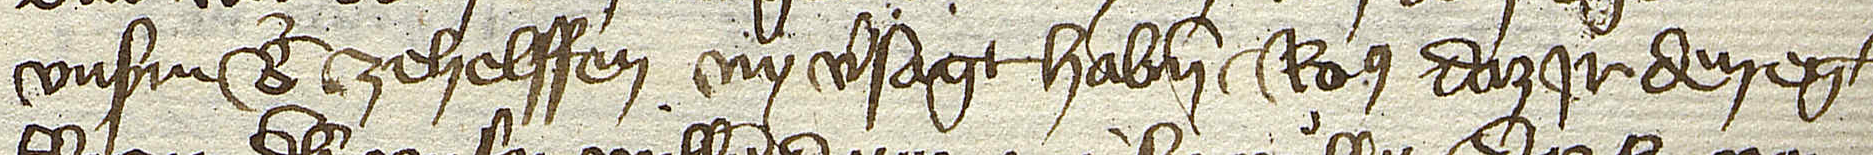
vnſ*m B* cʒehelffen ny v*ſagt hab*n / Ro* / daʒ Ir dem eg*
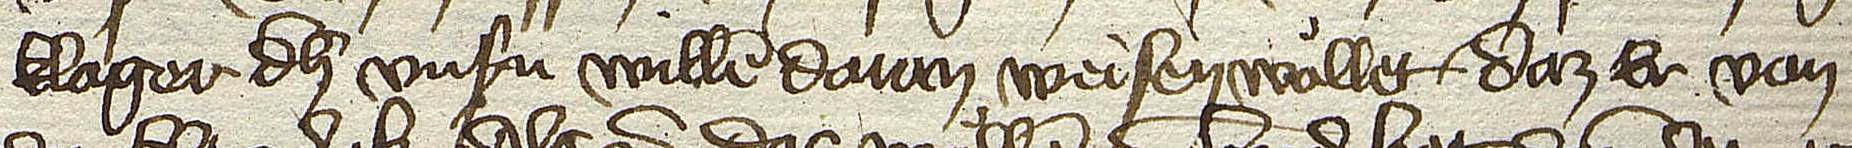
klager d*h* vnſ*n wille* daran weiſen wöllet / daʒ Er von
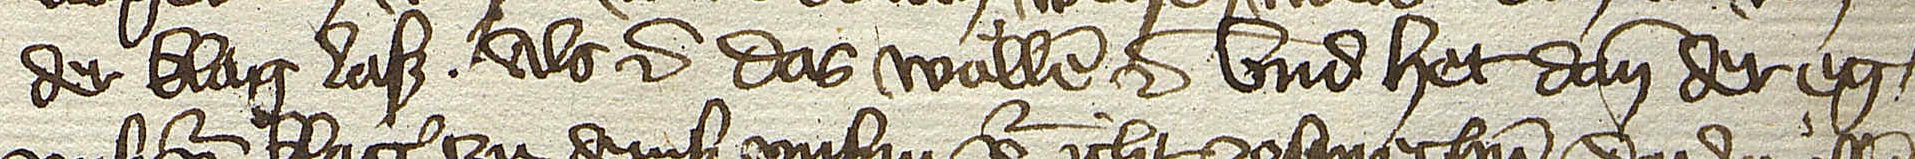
der klag laſʒ . Als ec* das wölle* ec* vnd het dan* der eg*
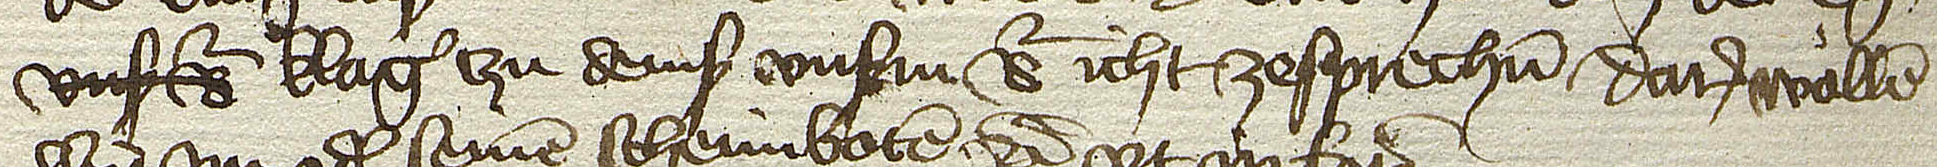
vnſ* B* klag* cʒu demſ* vnſ*m b* icht cʒeſprech*n / dar* wölle*
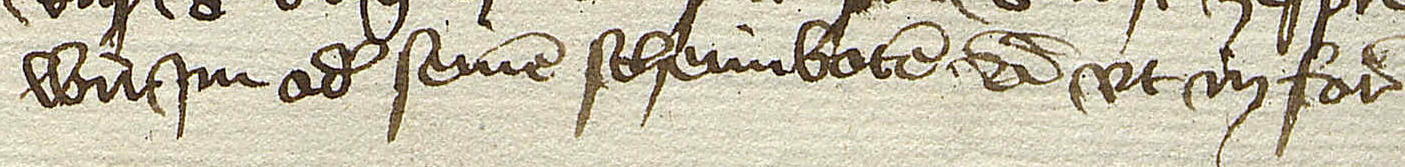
wir Im od* ſeine* ſcheinbote* ec* vt in for*
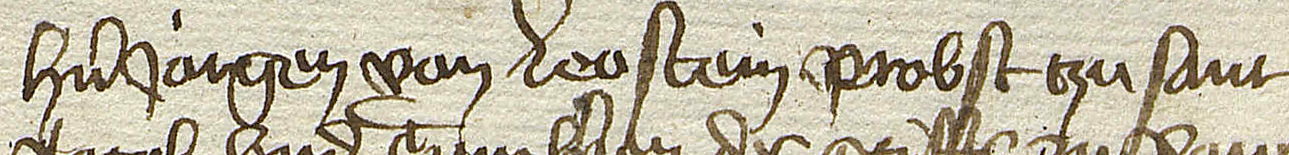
h*n Iörgen von Leoſtein probſt cʒu ſant
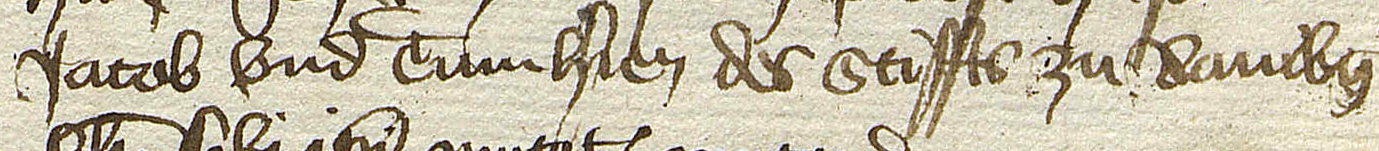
Iacob vnd Tumh*ren des Stiftts ʒu Bamb*g
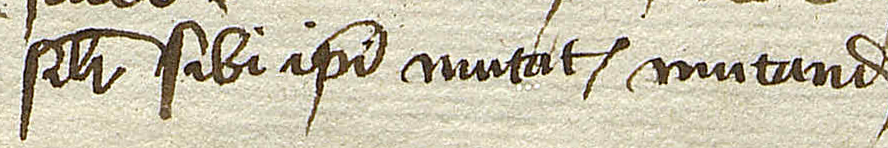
ſilr* ſibi ipi* mutat* mutand*
